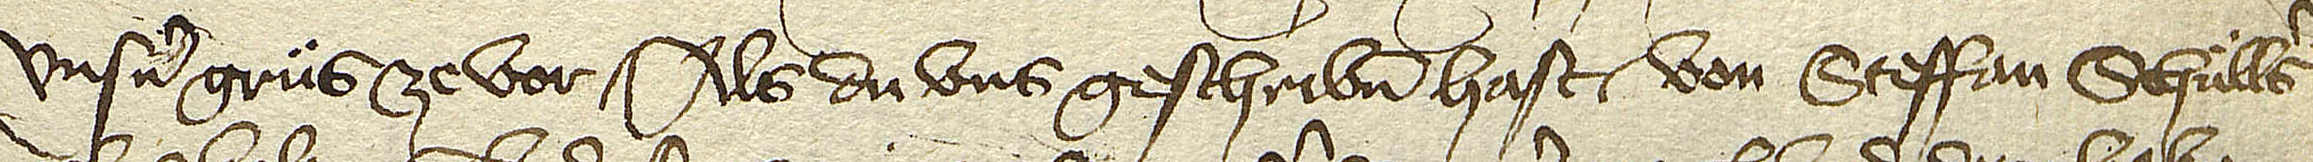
Vnſn* grüs cʒevor / Als du vns geſchribn* haſt / von Steffan Schülls*
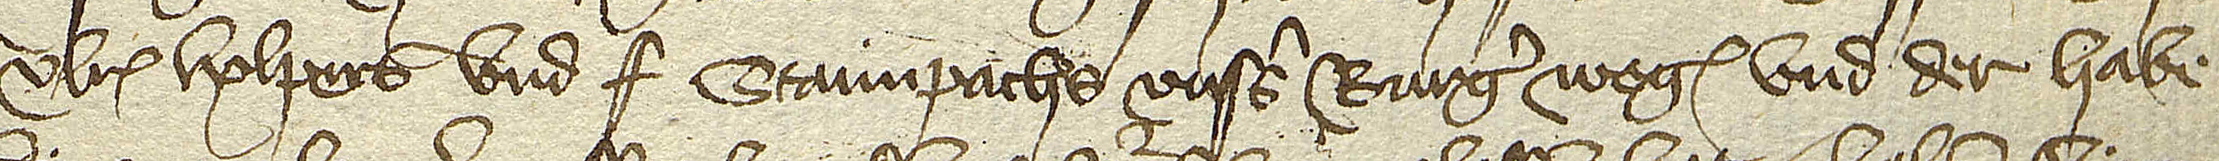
vlr* holpers vnd f Staimpachs vnſ*s Burg* weg* vnd der habe
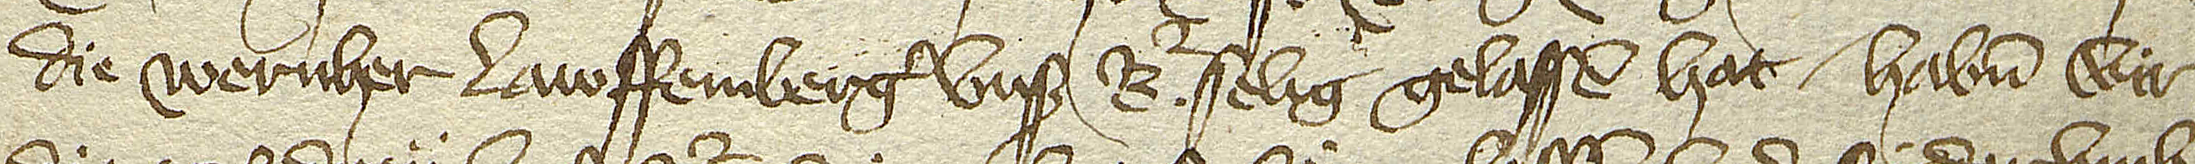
die wernher Lawffemberg* vnſ* B* ſelig gelaſſe* hat / habn* wir
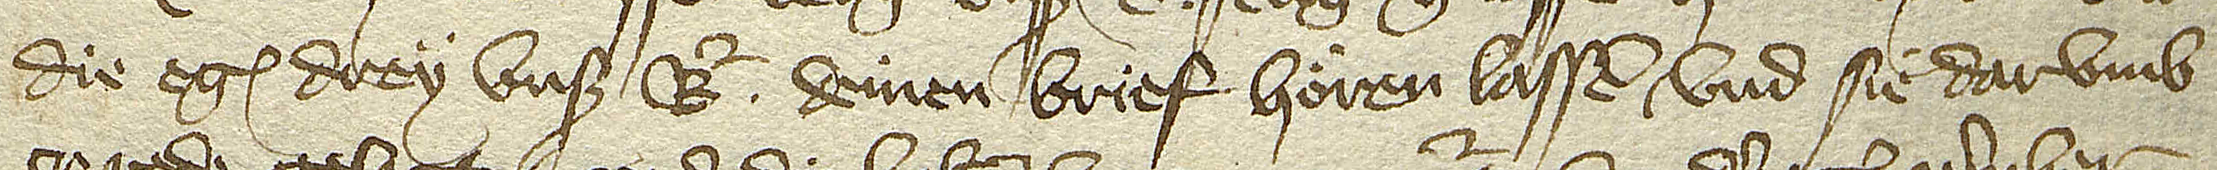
die eg* drey vnſ* B* deinen brief hören laſſe* / vnd ſie darvmb
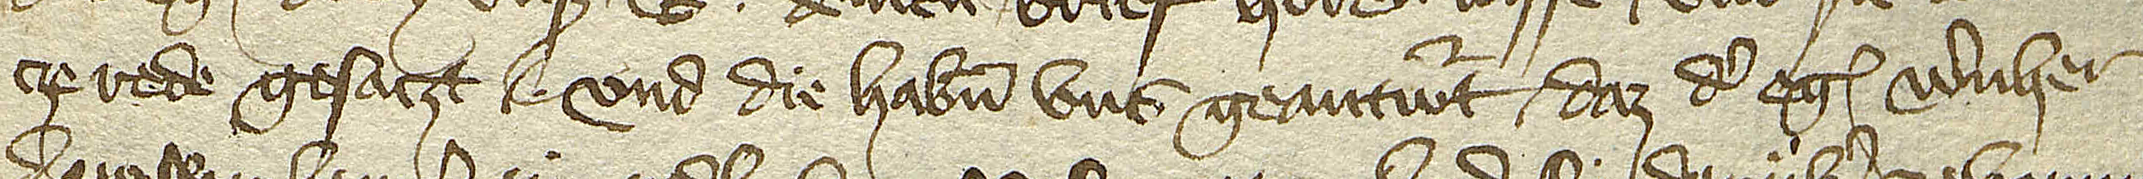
cʒe rede geſacʒt / . vnd die habn* vns geantwt* / daʒ d* eg* w*nher
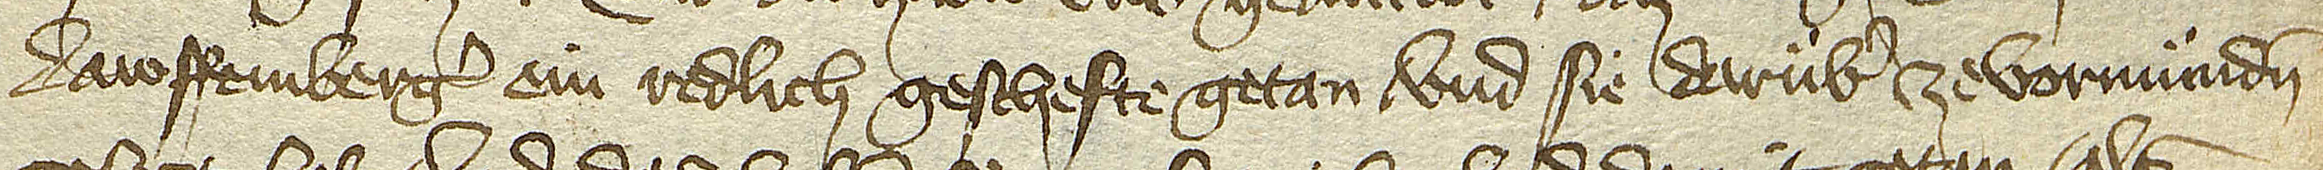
Lawffemberg* ein redlich geſchefte getan / vnd ſie darüb* cʒevormündn*
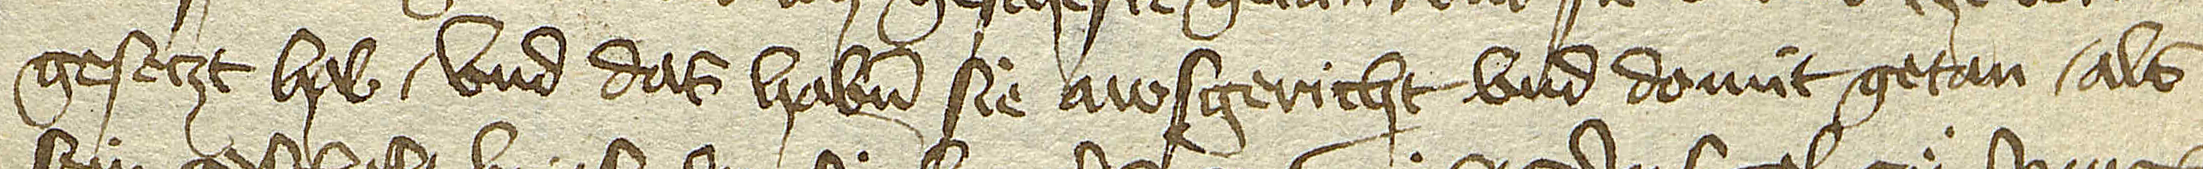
geſecʒt hab / vnd das habn* ſie awfgericht vnd damit getan / als
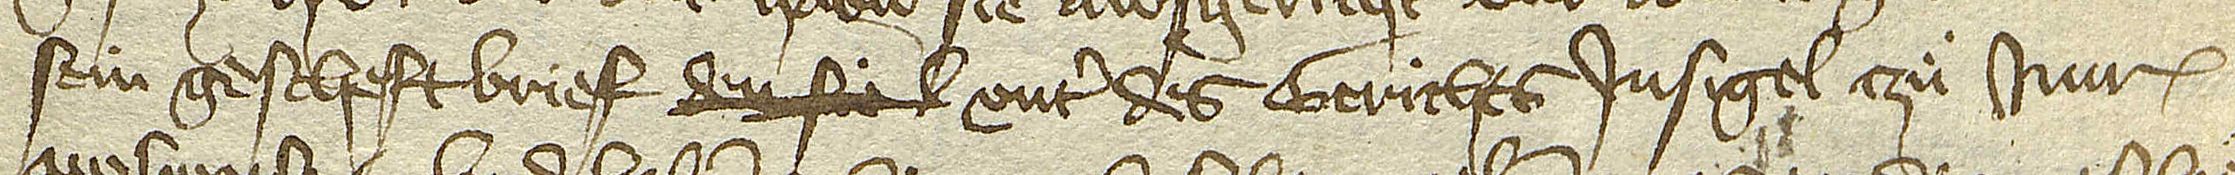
ſein geſcheft brief den ſie l vnt* des Gerichts Inſigel cʒü Nur*
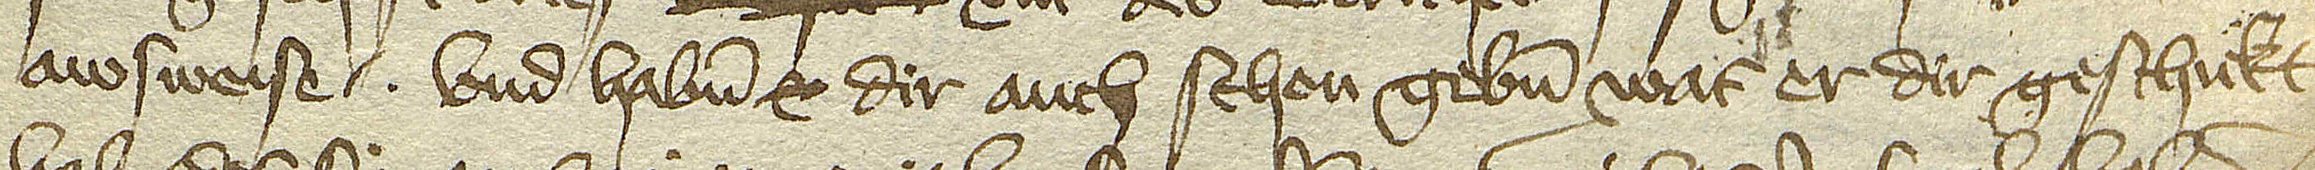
awſweiſe / . vnd habn* % dir auch ſchon gebn* was er dir geſchickt
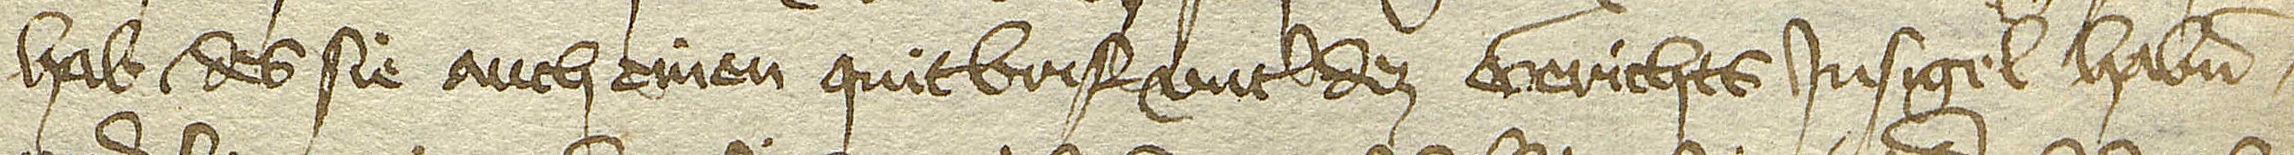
hab / des ſie auch einen quitbrif vnt* deʒ Gerichts Inſigel habn* /
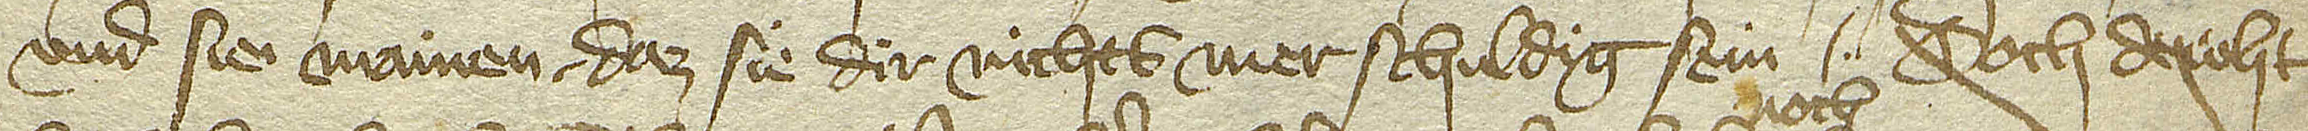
vnd ſie mainen / daʒ ſie dir nichts mer ſchuldig ſein /. Doch dewht
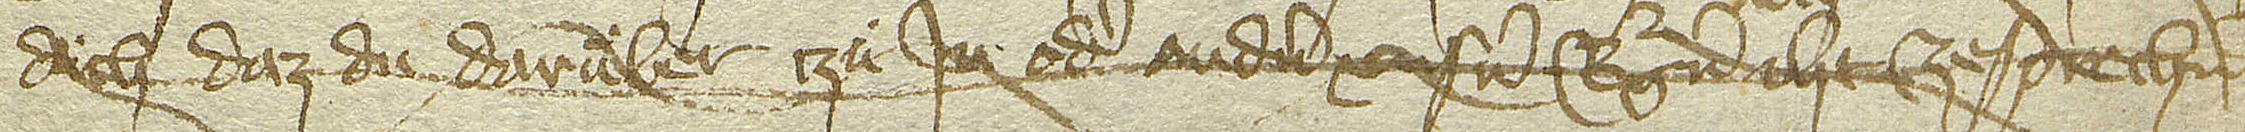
dich daʒ du darüber cʒü In od* andn* vnſn* B*gn* iht cʒeſprechn*
